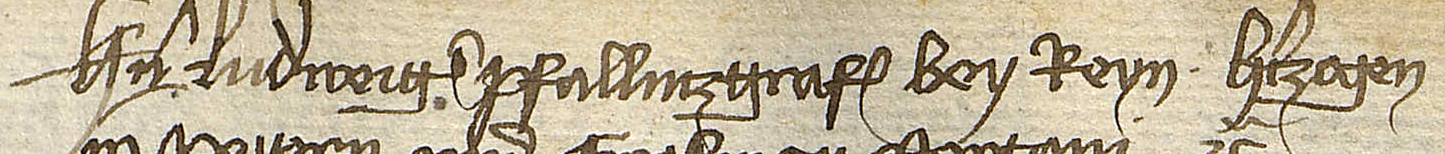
Hn* Ludweig* pfallncʒgraf* bey Reyn . h*cʒogen
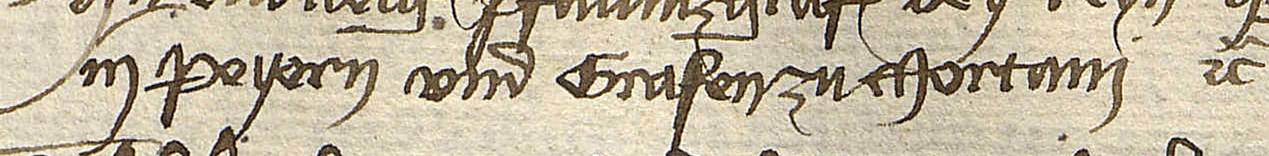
in Peyern vnd Grafen ʒu Mortani ec*
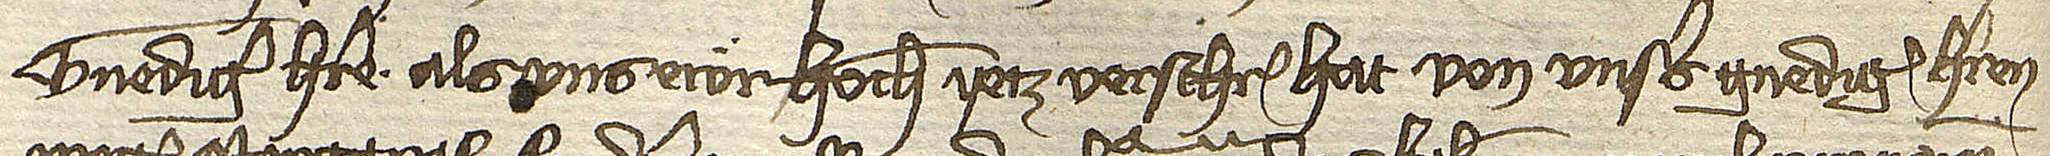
Gnedig* h*re . als vns eẅr hoch* yecʒ verſchr* hat von vnſs* gnedig* h*ren
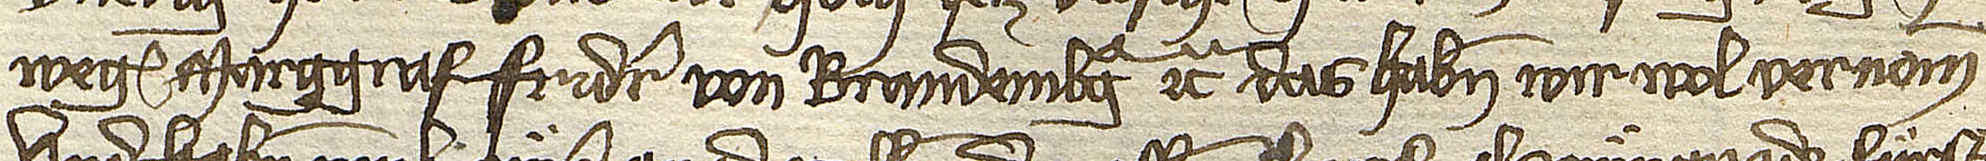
weg* Marggraf fridr* von Brandemb*g ec* / das habn* wir wol vernom*
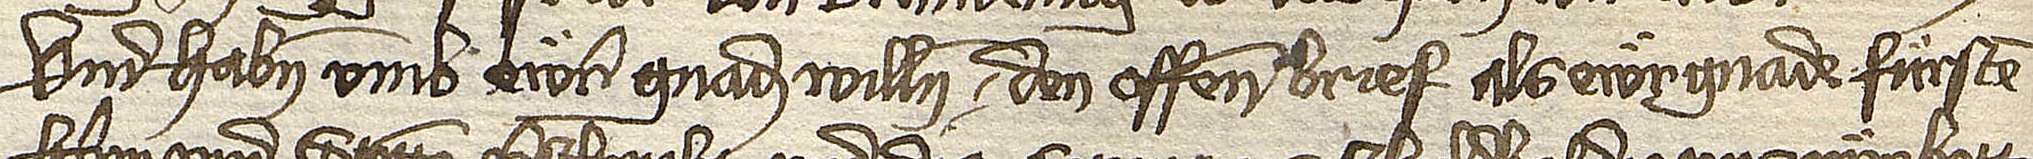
Vnd habn* vmb eẅr* gnad* willn* / den offen* brief als eẅr gnade fürſte*
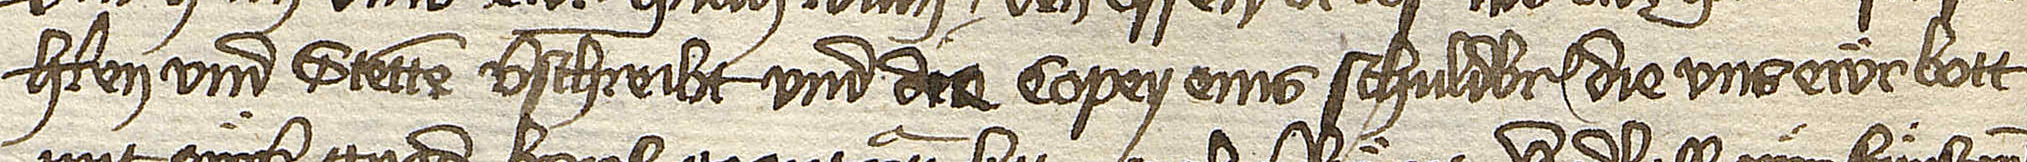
h*ren vnd Stette* v*ſchreibt vnd der Copey eins ſchuldbr* die vns eẅr bott
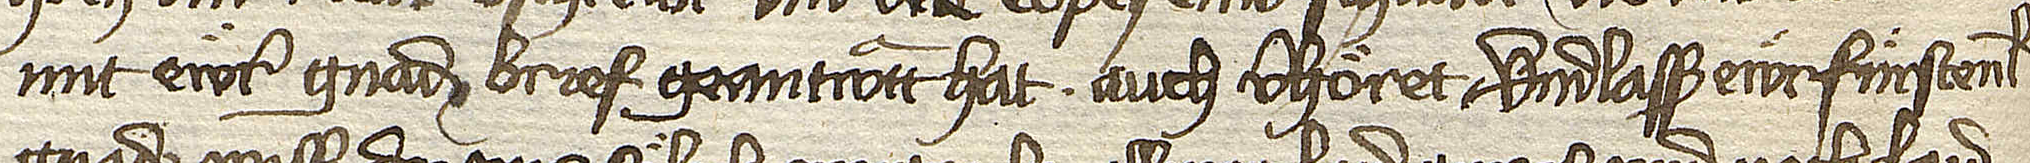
mit eẅr* gnad* brief geantw*tt hat . auch v*höret / Vnd laſſ* eẅr fürſtenl*
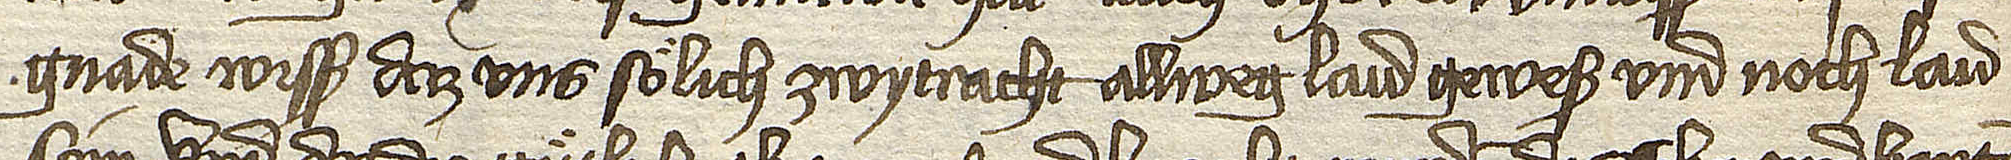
gnade wiſſ* daʒ vns ſölich ʒeytracht allweg laid geweſ* vnd noch laid
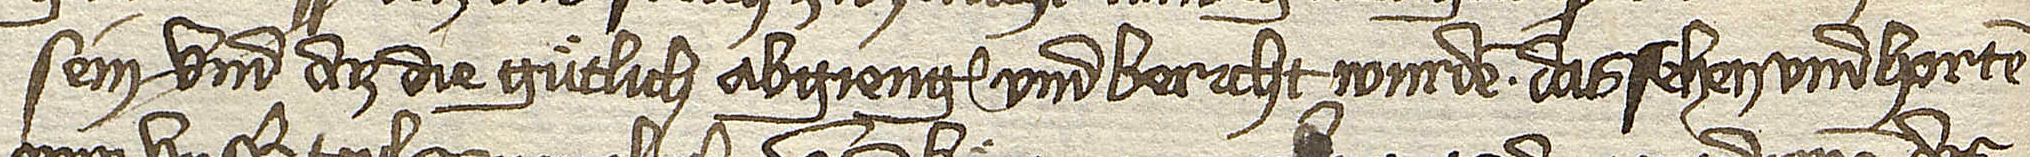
ſein Vnd da die gütlich abgieng* vnd bericht wurde* . das ſehen vnd horte*
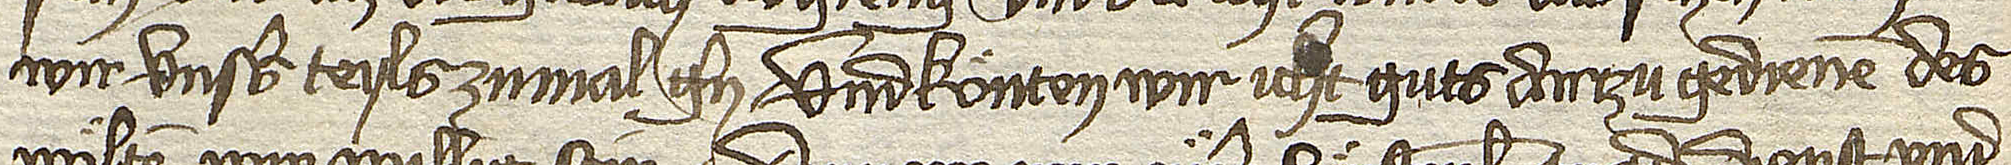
wir Vnſ*s teyls ʒumal g*n / Vnd könten wir icht guts darcʒu gediene* des
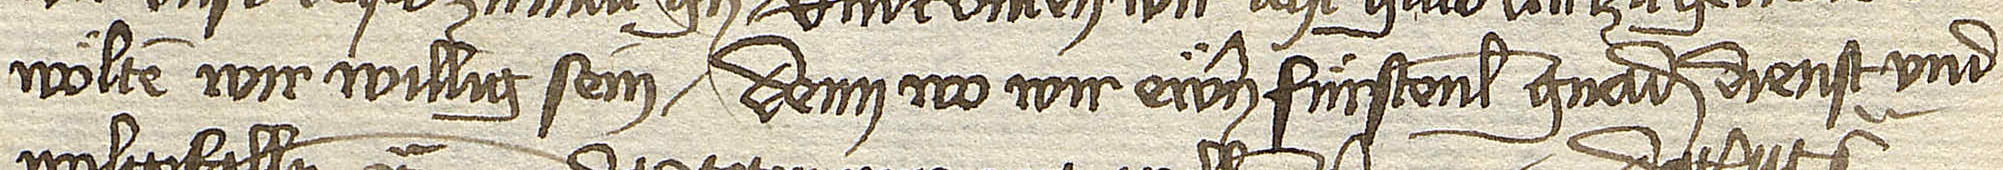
wölte* wir willig ſein / Denn wo wir eẅ*n fürſenl* gnad* dienſt vnd
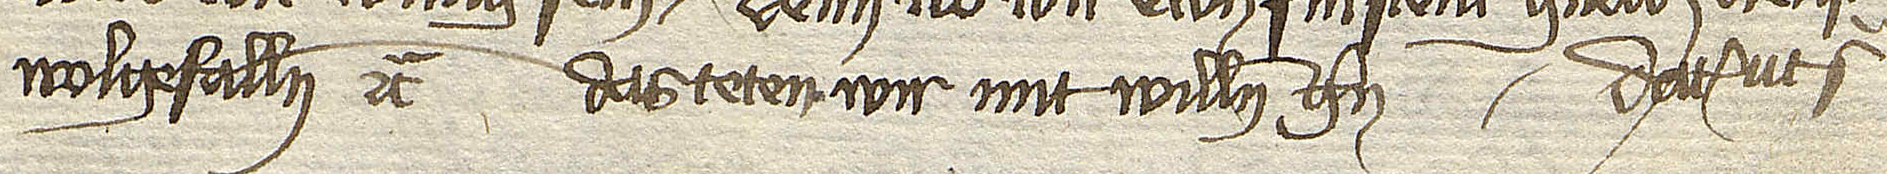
wolgefalln* ec* das teten wir mit willn* g*n / Dat* ut ſ*
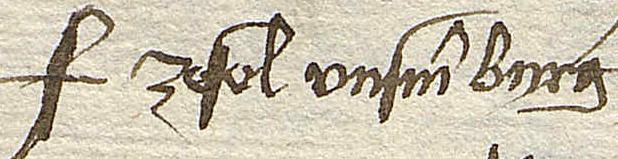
F* cʒefel vnſm* burg*
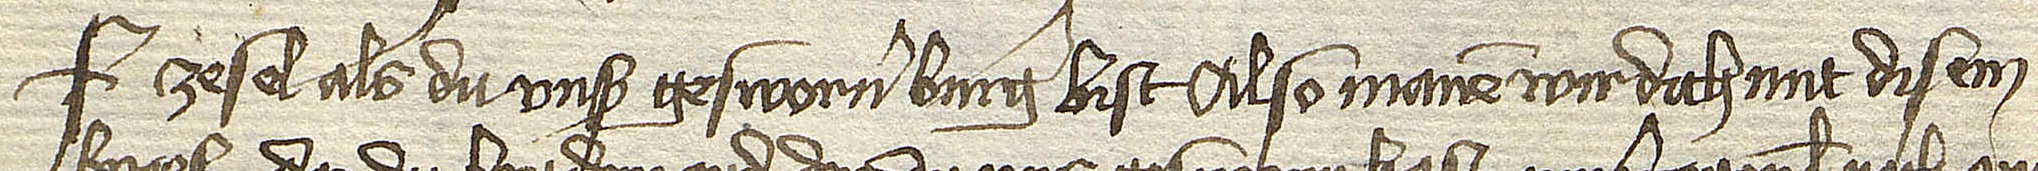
F* cʒefel als du vnſ* geſworn* burg* biſt Alſo mane* wir dich mit diſem
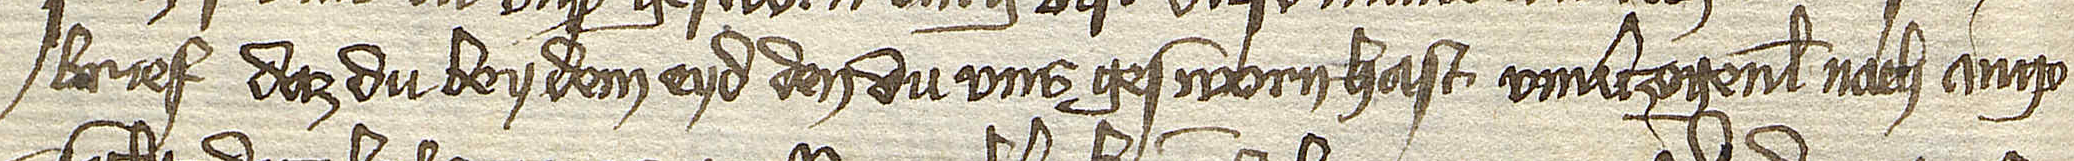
brief daʒ du bey dem eyd den du vns geſworn haſt vnu*cʒogenl* nach ange
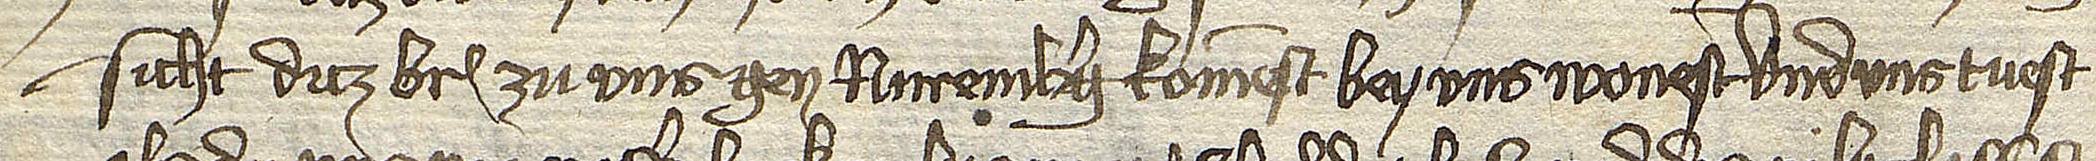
ſicht dicʒ br* ʒu vns gen Nuremb*g kom*eſt bey vns woneſt Vnd vns tueſt
